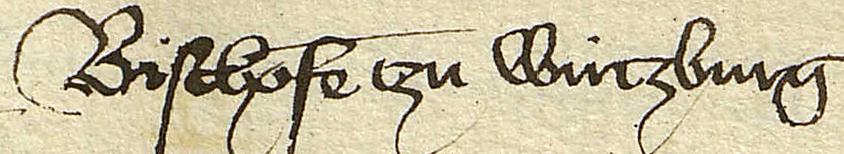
Biſchofe* cʒu wircʒburg
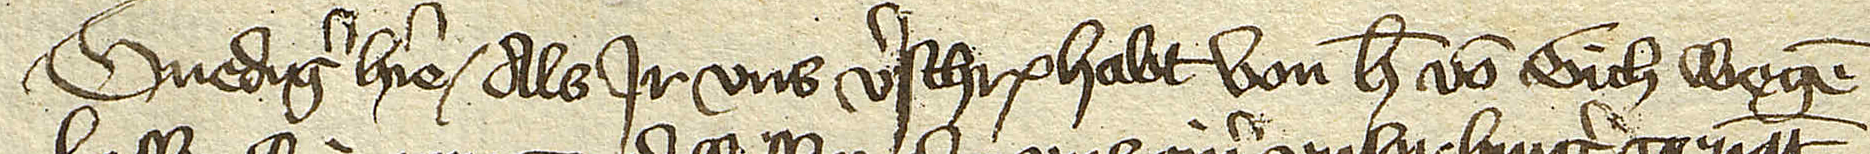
Gnedig* h*re / Als Ir vns v*ſchr* habt von h* vo* Gich wege*
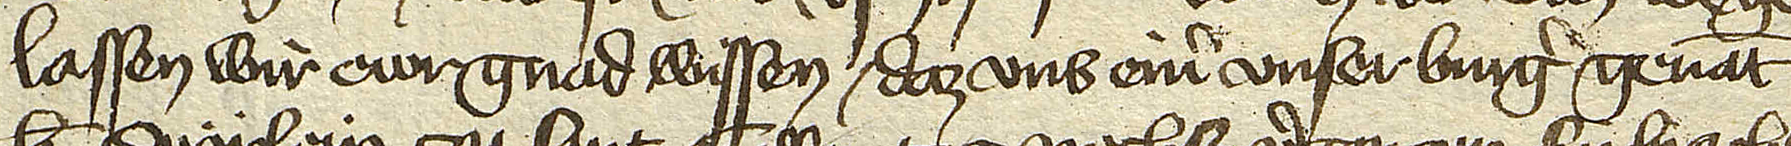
laſſen wir ewr gnad wiſſen / daʒ vns ein* vnſer burg* genat*
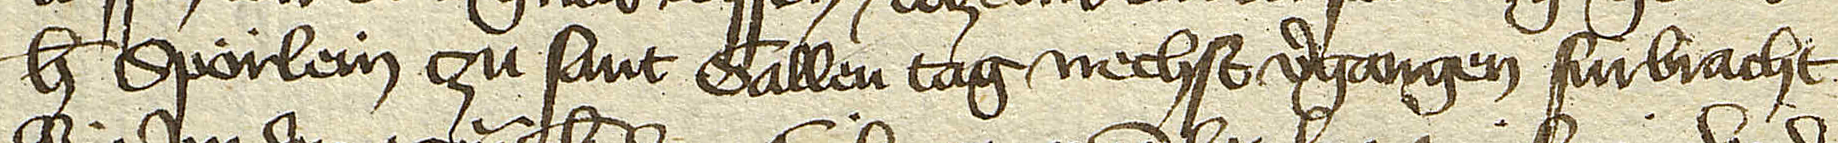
h* Spörlein cʒu ſant Gallen tag nechſt v*gangen fürbracht
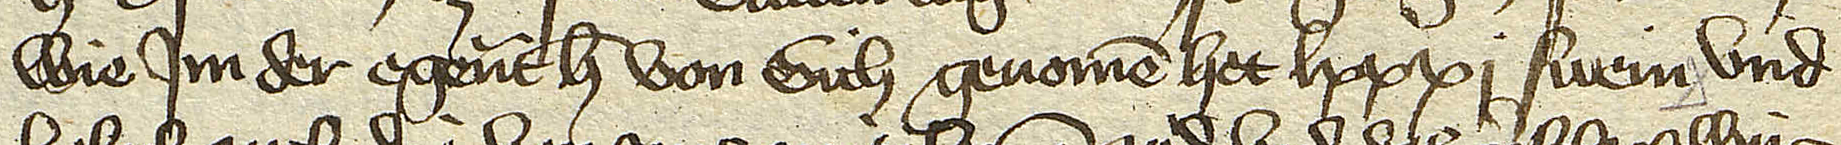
wie Im der egent* h* von Gich genome* het lxxxi ſwein vnd
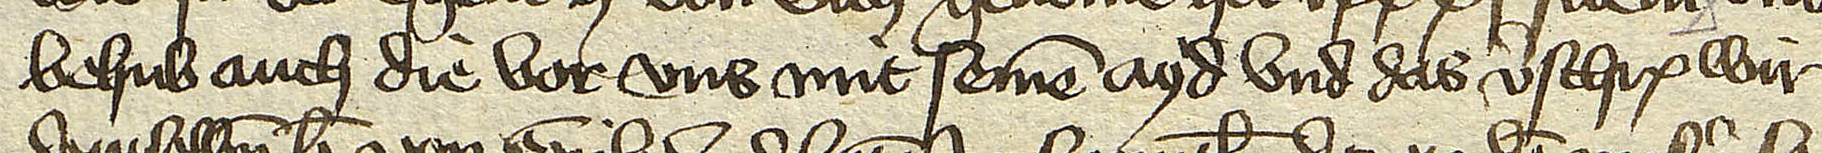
behub auch die vor vns mit ſeine* ayd vnd das v*ſchr* wir
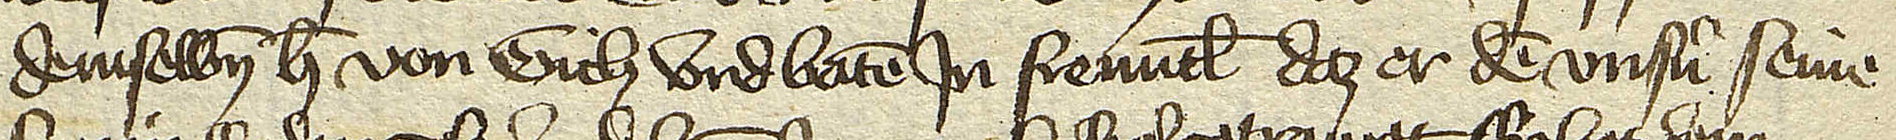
demſelbn* h* von Gich vnd bate* In freuntl* daʒ er de* vnſn* ſeine
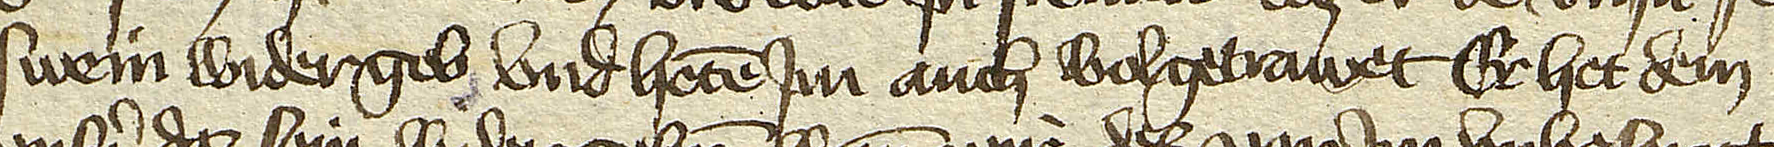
ſwein widergeb vnd hete* Im auch wol getrawet Er het dem
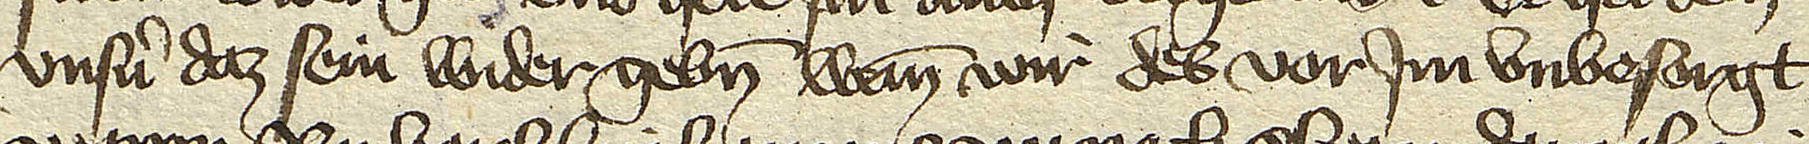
vnſn* daʒ ſein wider gebn* wan* wir des vor Im vnbeſorgt
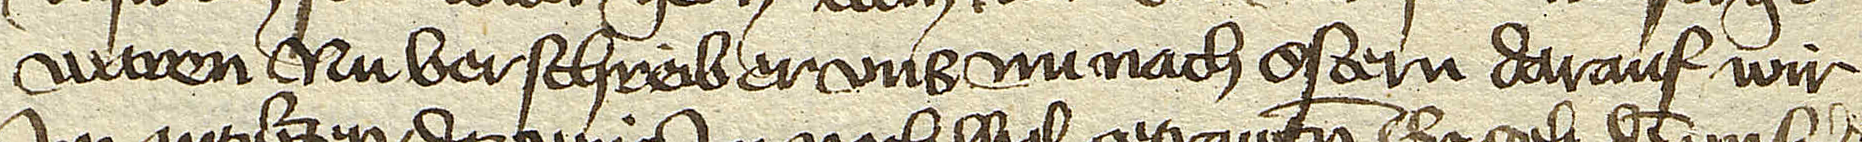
waren Nu verſchreib er vns nu nach Oſtern darauf wir
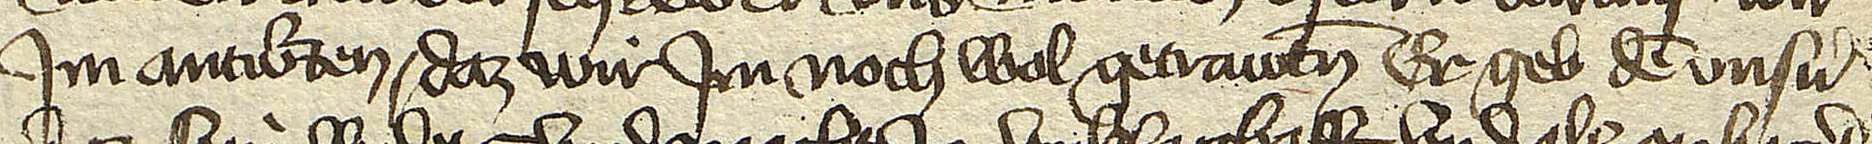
Im antwt*en / daʒ wir Im noch wol getrawtn* Er geb de* vnſn*
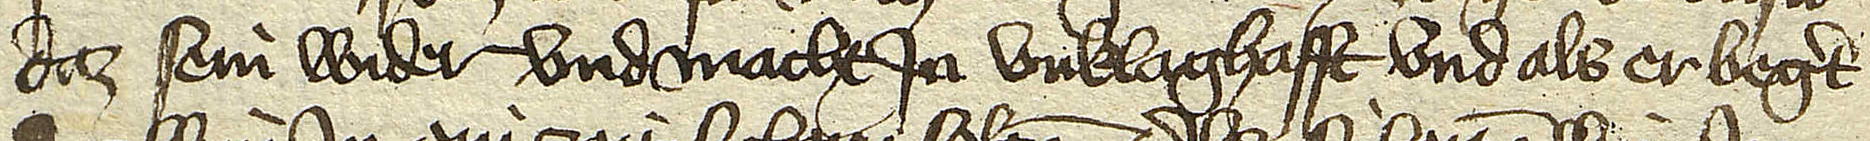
daʒ ſein wider vnd macht In vnklaghafft vnd als er begt*
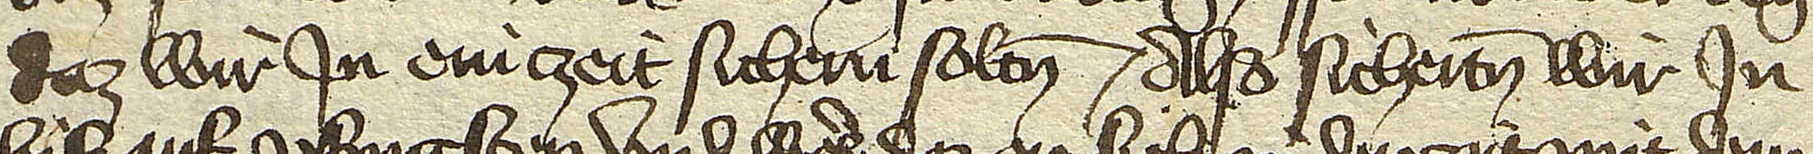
daʒ wir In eincʒeit ſichern ſoltn* / Alſo ſichertn* wir In
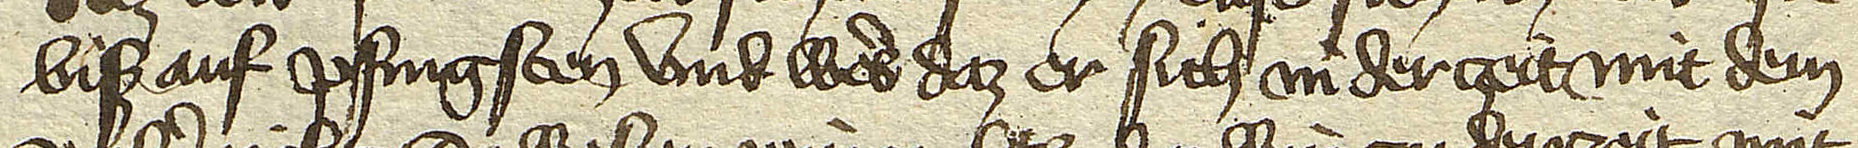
biſʒ auf pfingſten vnd wes* daʒ er ſich in der cʒeit mit dem
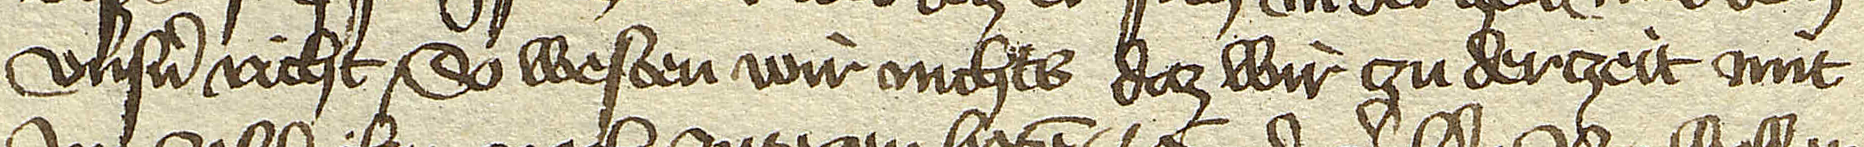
vnſn* richt / So weſten wir nichts daʒ wir cʒu dercʒeit mit
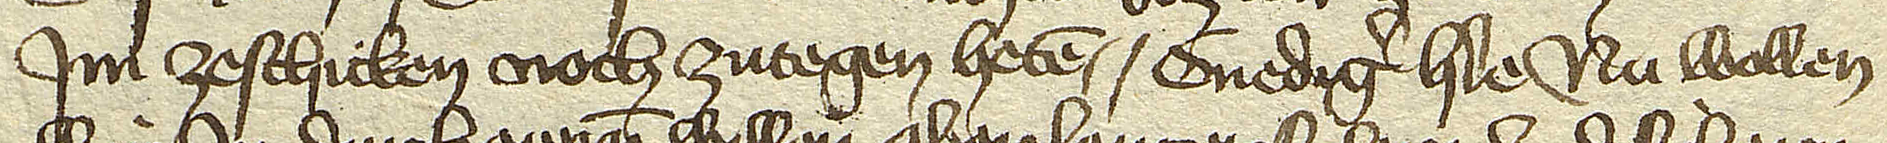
Im cʒeſchicken noch cʒutegen hete* / / Gnedig* h*re Nu wollen
